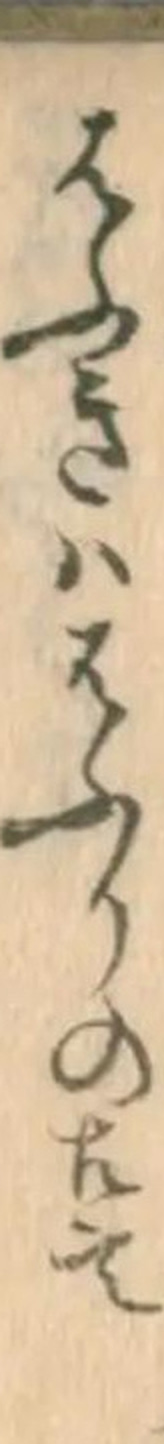はふきははふりの古言
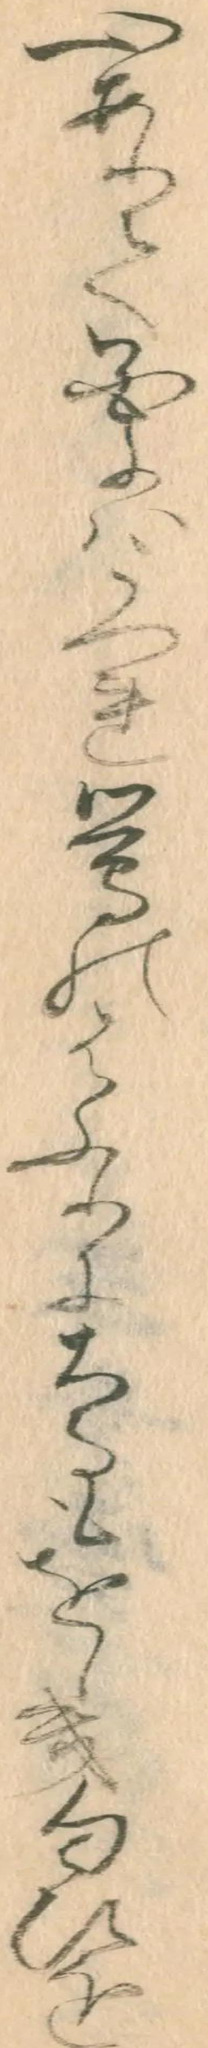心ありて花にはうつれ鶯のはふりにちるもをしき匂ひを
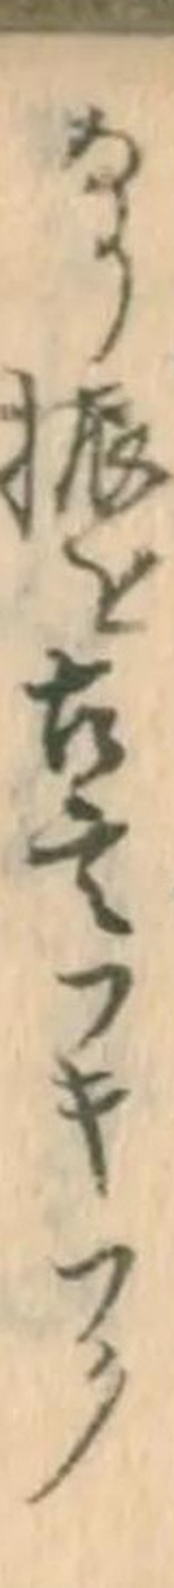なり振を古言フキフク
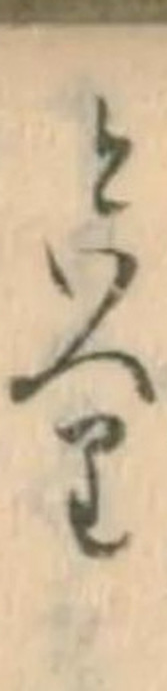といへり
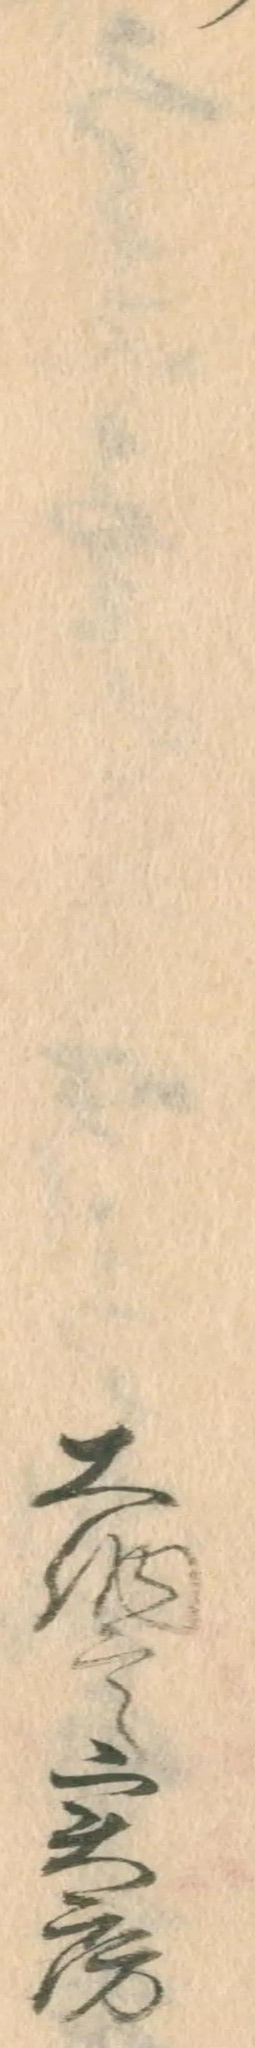大納言実房
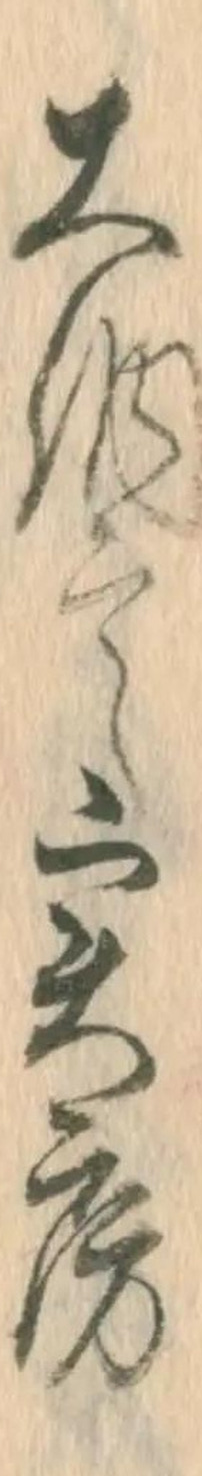大納言実房
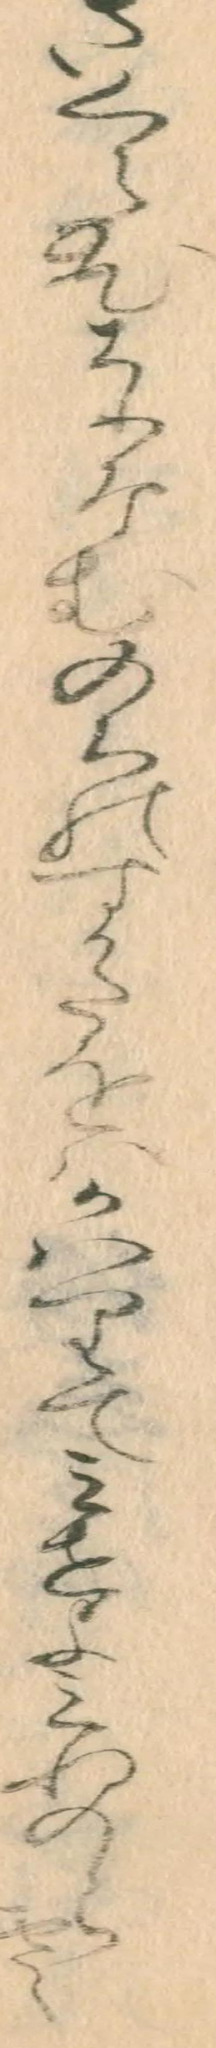さくら花ちりなむのちのすかたをはかはりてみせよみねのしら雲
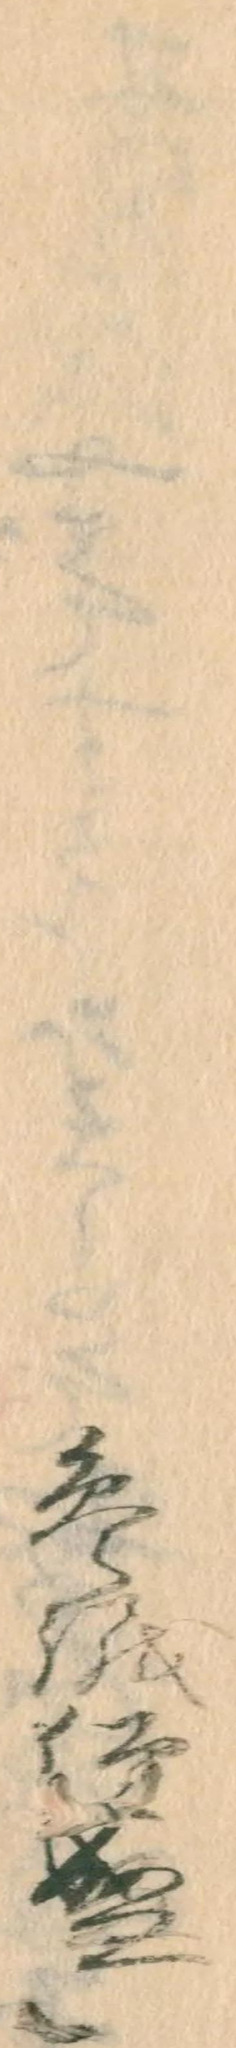参議伊盛
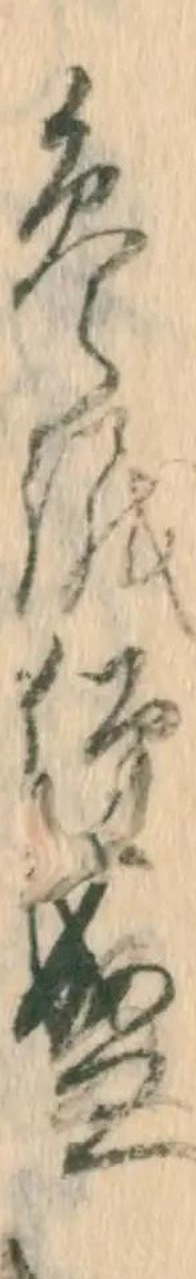参議伊盛
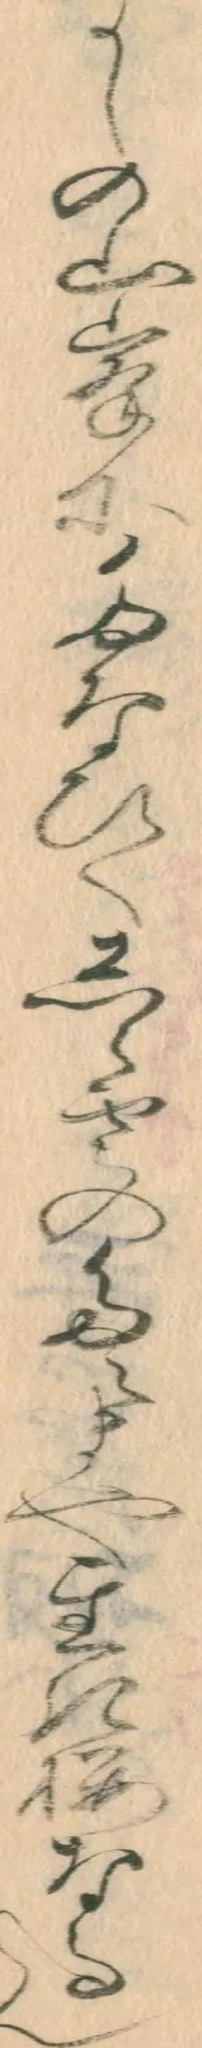よしの山峰にたなひくしら雲のたえまや遅き桜なるらん
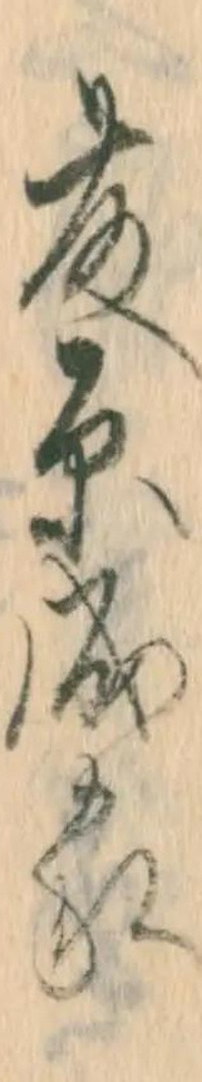藤原成家
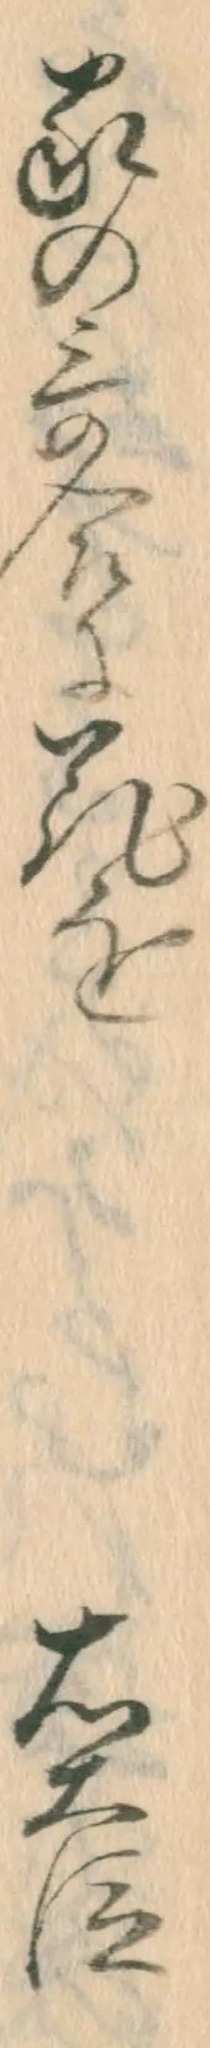家の歌合に花を右大臣
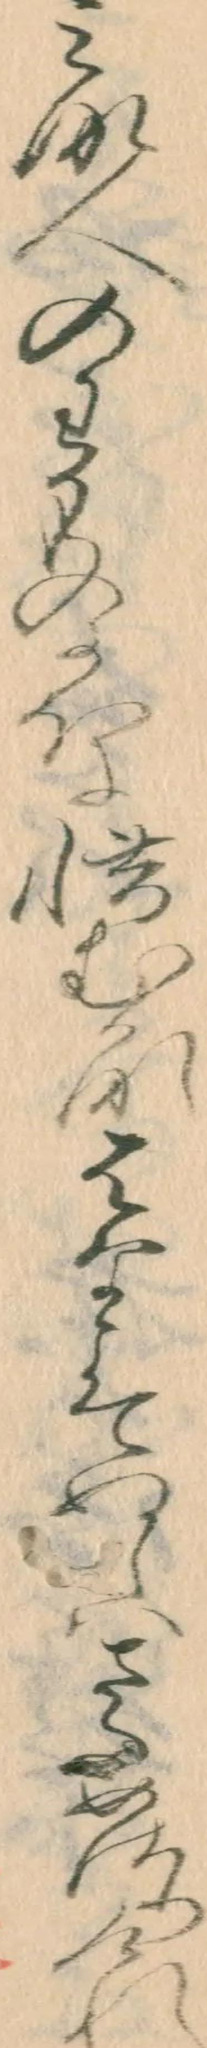みな人のわかものかほに惜むかなはなこそぬしはさためさりけれ
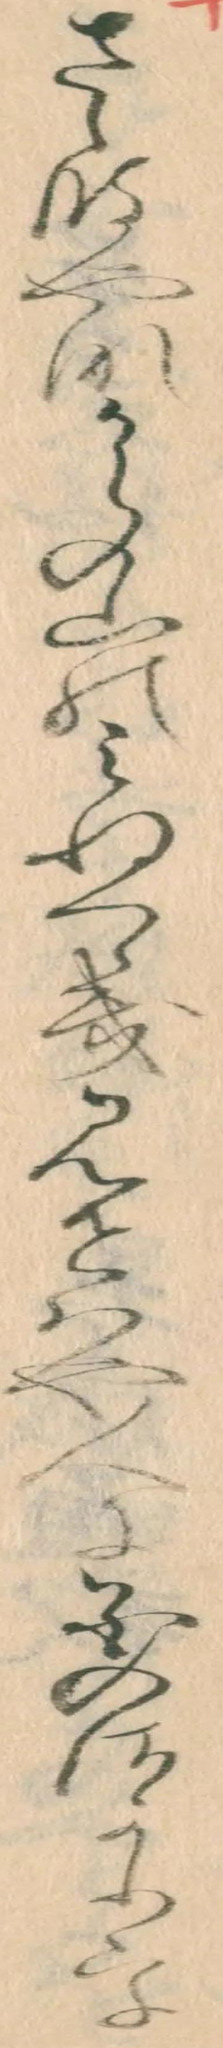さゝ波やなからの山のみねつゝき見せはや人に花のさかりを
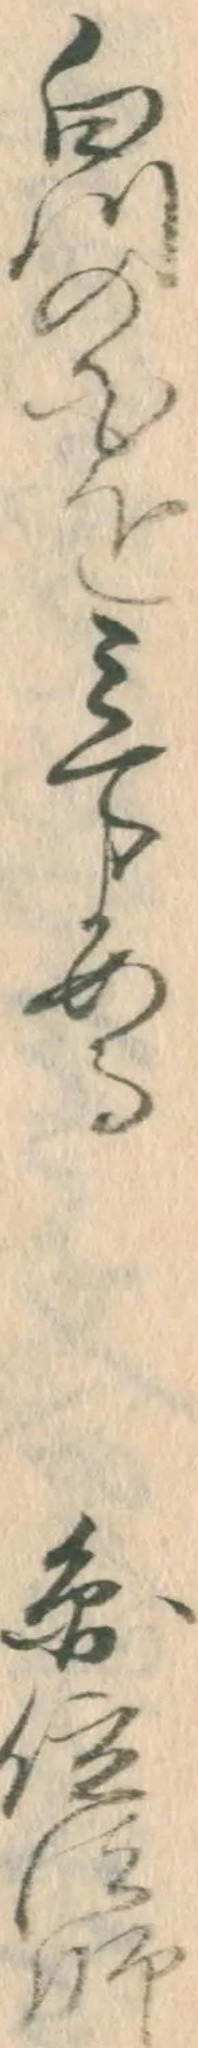白川の花をみてよめる道因法師
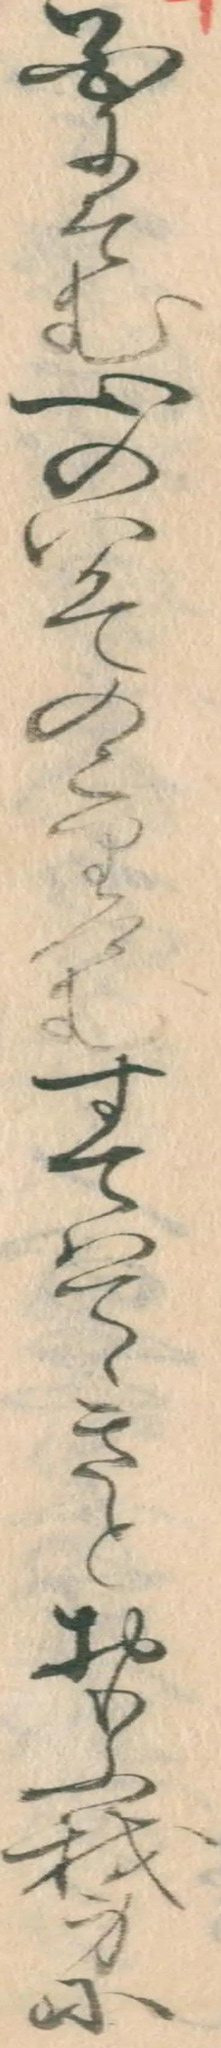花にそむ心のいかてのこりけむすてはてゝきとおもふ我身に
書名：月詣和歌集
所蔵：国立国会図書館 National Diet Library, JAPAN
